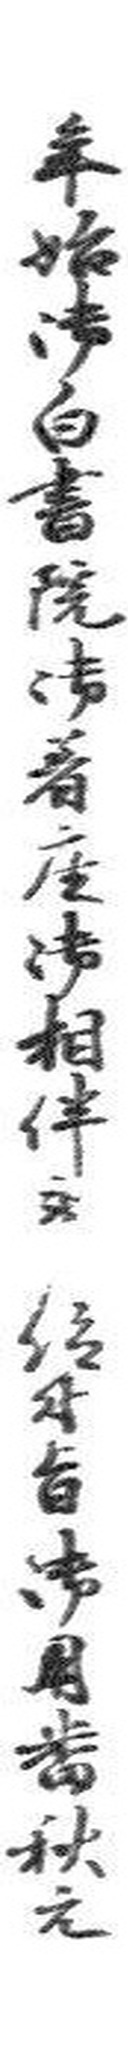年始御白書院御着座御相伴被仰付旨御用番秋元
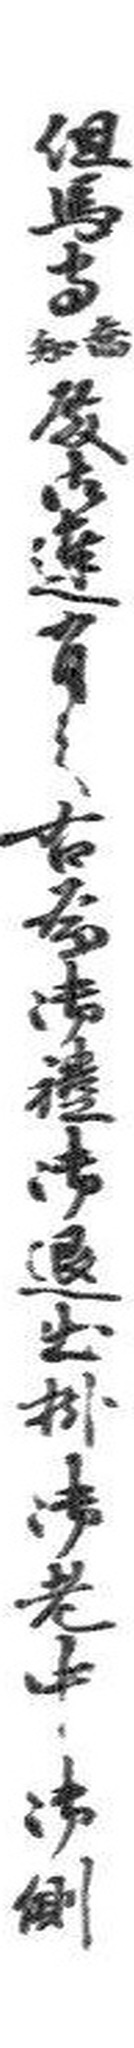但馬守喬知殿御達有之右為御礼御退出掛御老中御側
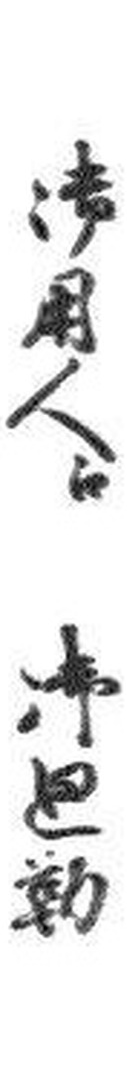御用人江御廻勤
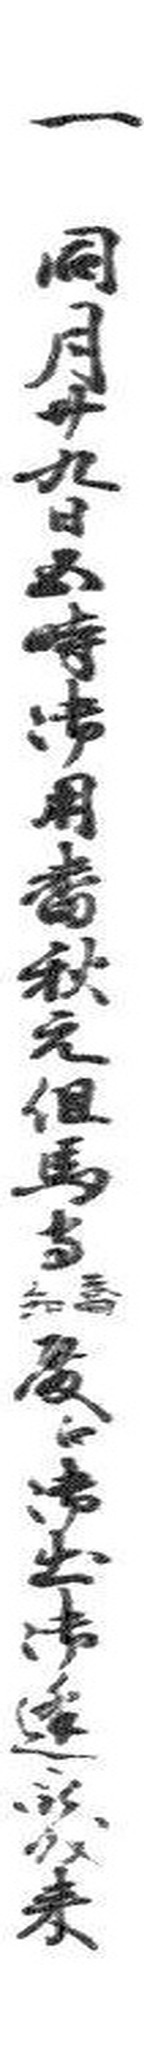一同月廿九日五時御用番秋元但馬守喬知殿江御出御逢被成来
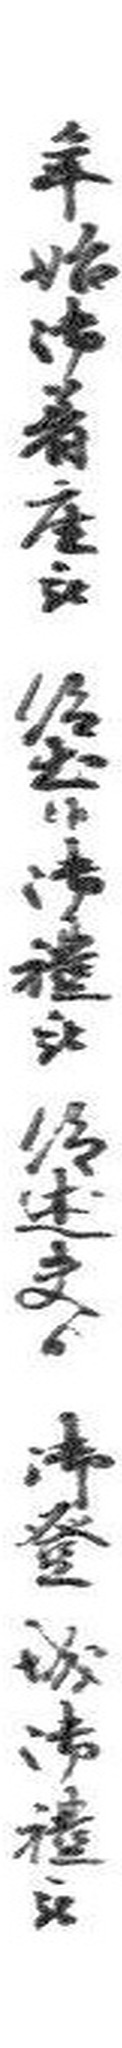年始御着座被仰出候御礼被仰述夫ゟ御登城御礼被

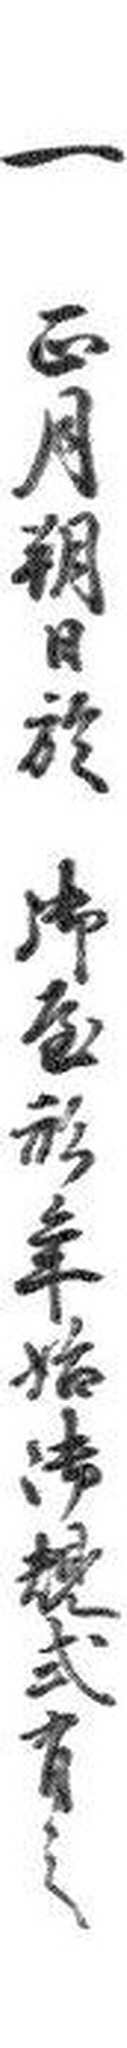一正月朔日於御屋形年始御規式有之
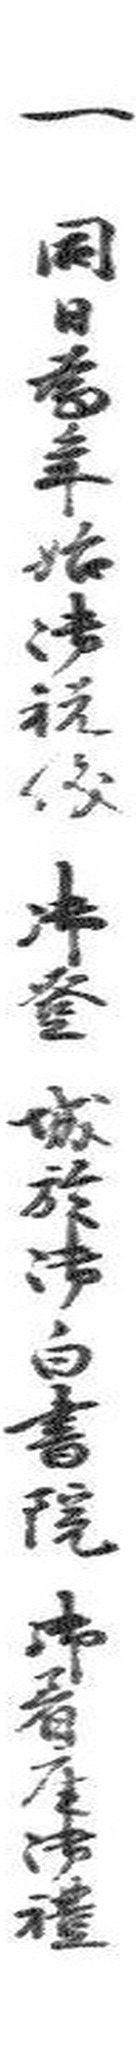一同月為年始御祝儀御登城於御白書院御着座御礼
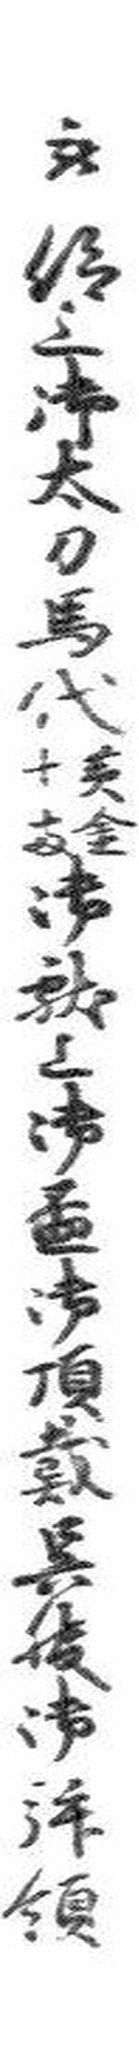被仰上御太刀馬代黄金十両御献上御盃御頂戴呉服御拝領
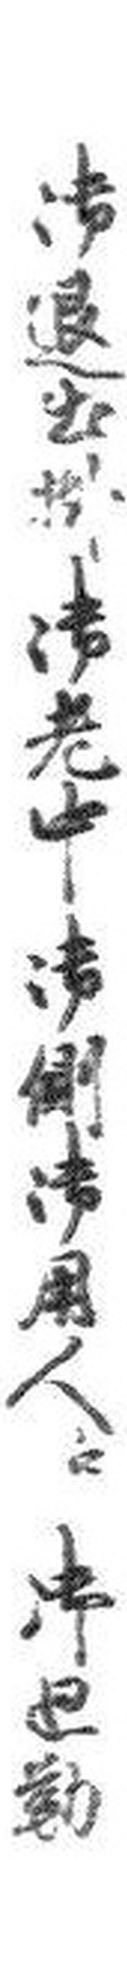御退出掛御老中御側御用人江御廻勤
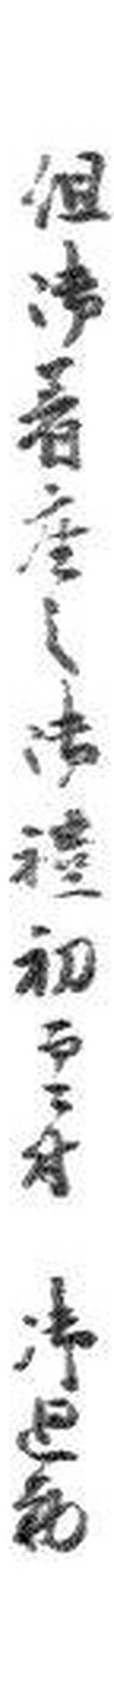但御着座之御礼初而ニ付御廻勤
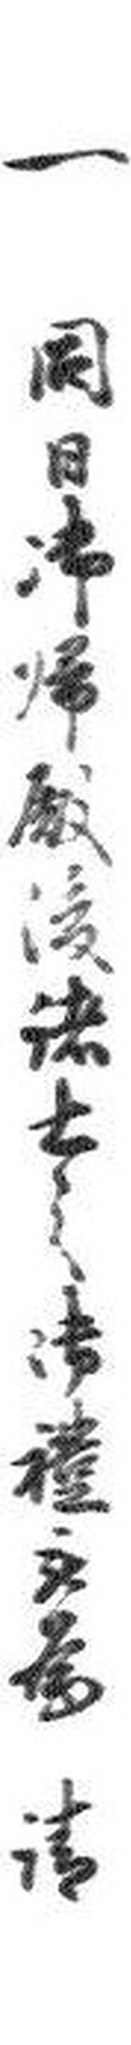一同日御帰殿後諸士之御礼被為請

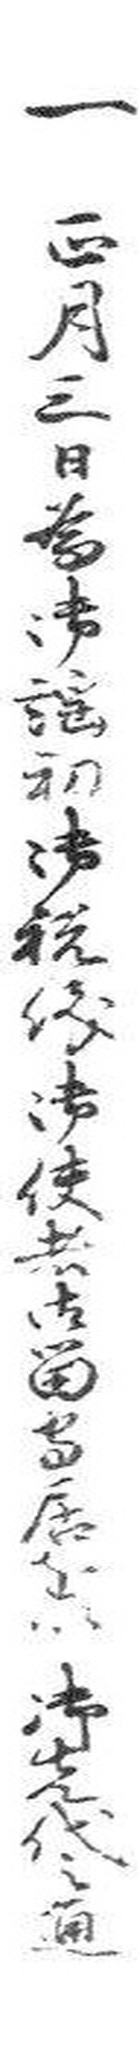一正月三日為御謡初御祝儀御使者御留守居を以御先代之通
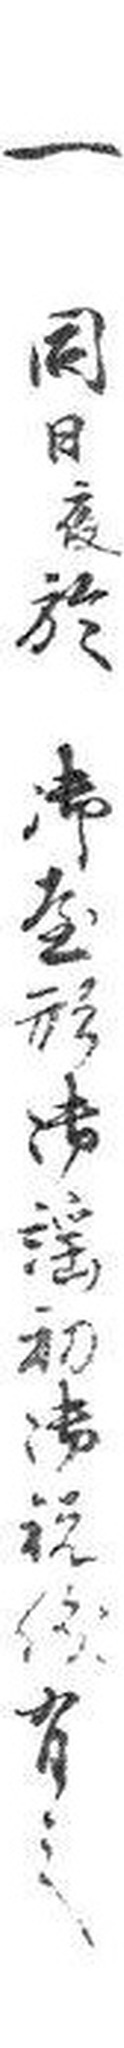一同日夜於御屋形御謡初御祝儀有之
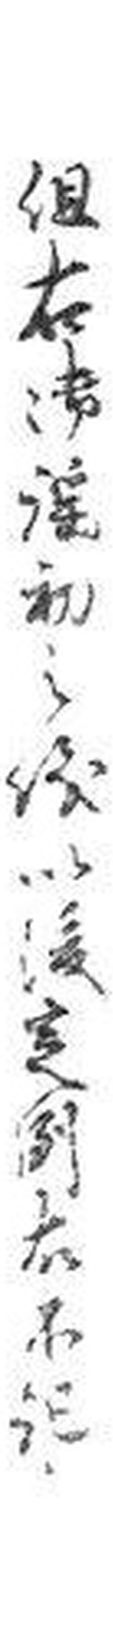但御謡初之儀以後定例故不記之
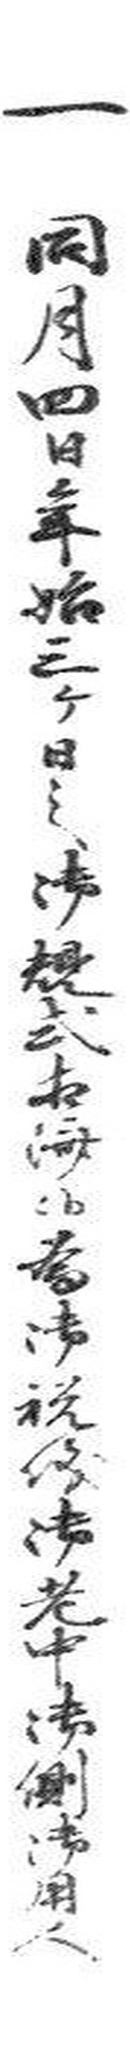一同月四日年始三ケ日之御規式相済候為御祝儀御老中御側御用人
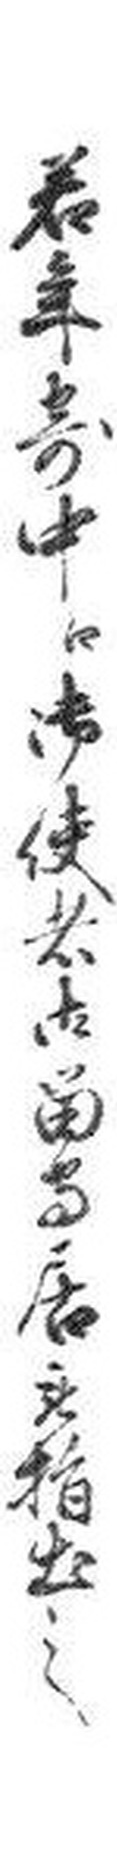若年寄中江御使者御留守居被指出之
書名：家譜 二十八 吉邦公 従宝永七年七月五日到正徳元年十二月
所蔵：福井県文書館 Fukui Prefectural Archives
